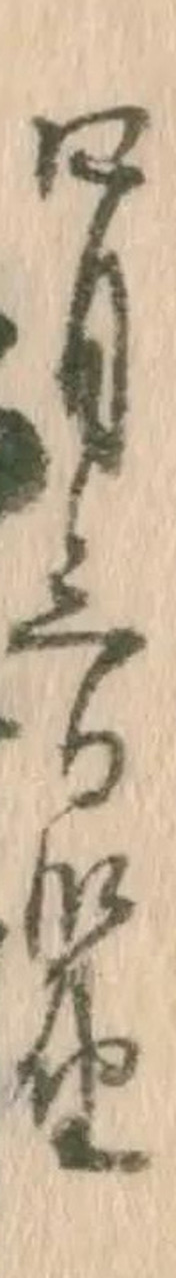四月三日御届
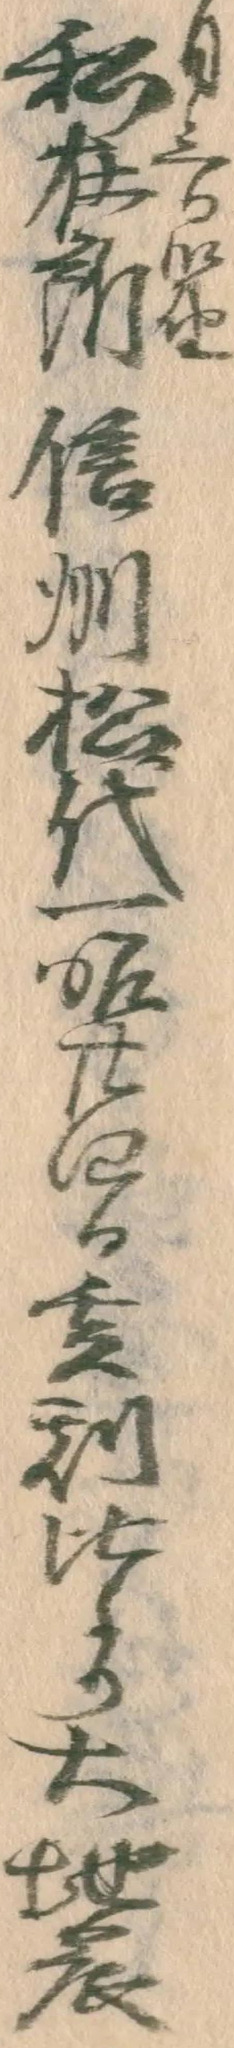私在所信州松代一昨廿四日亥刻比より大地震
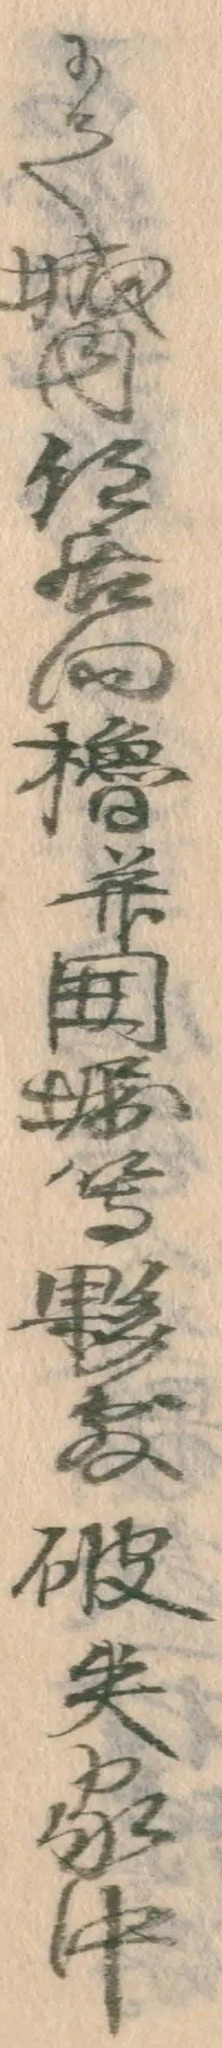にて城内住居向櫓并囲塀等夥敷破失家中
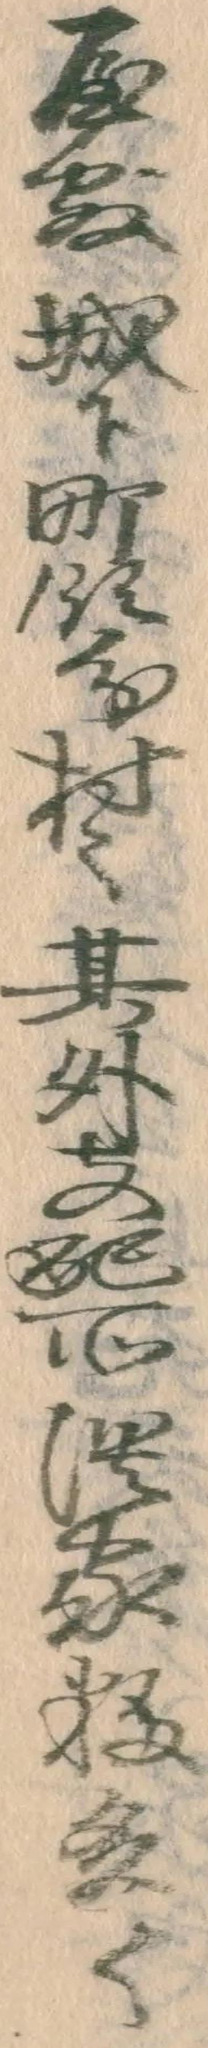屋敷城下町領分村々其外支配所潰家数多く
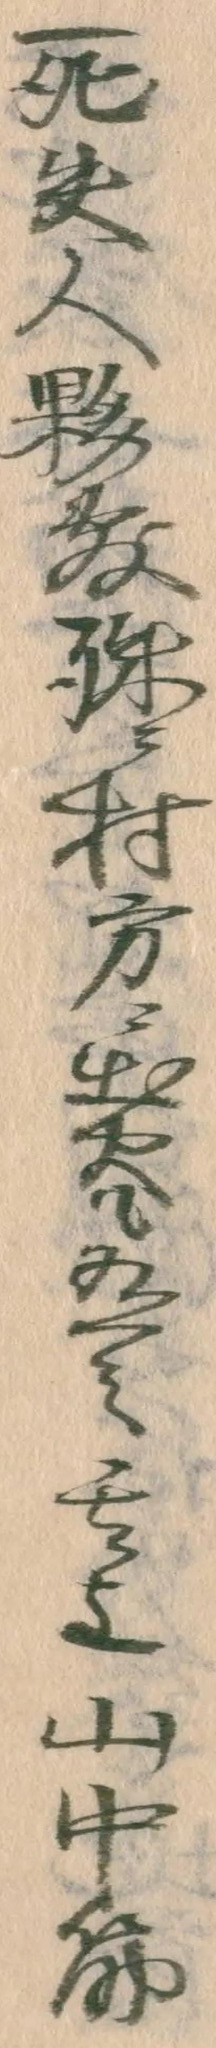死失人夥敷殊ニ村方ニ出火も有之其上山中筋
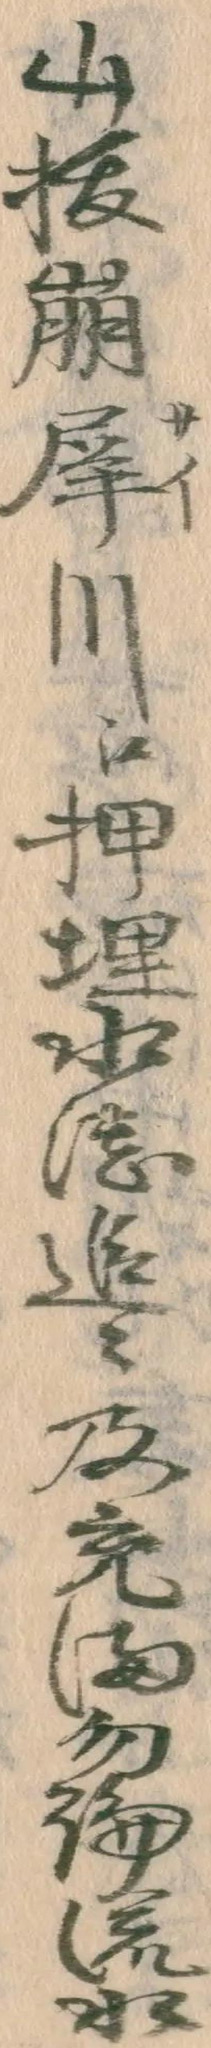山抜崩犀川江押埋水湛追々及充満勿論流水
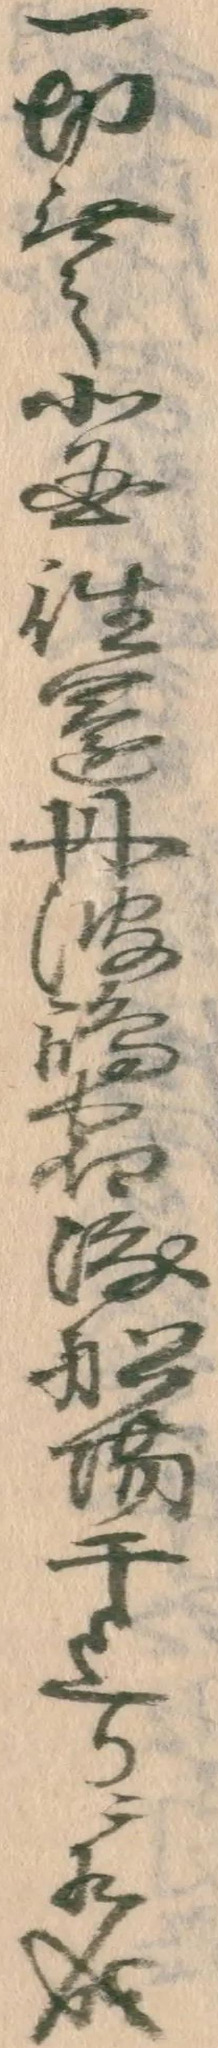一切無之北国往還丹波島宿渡船場干上りニ相成
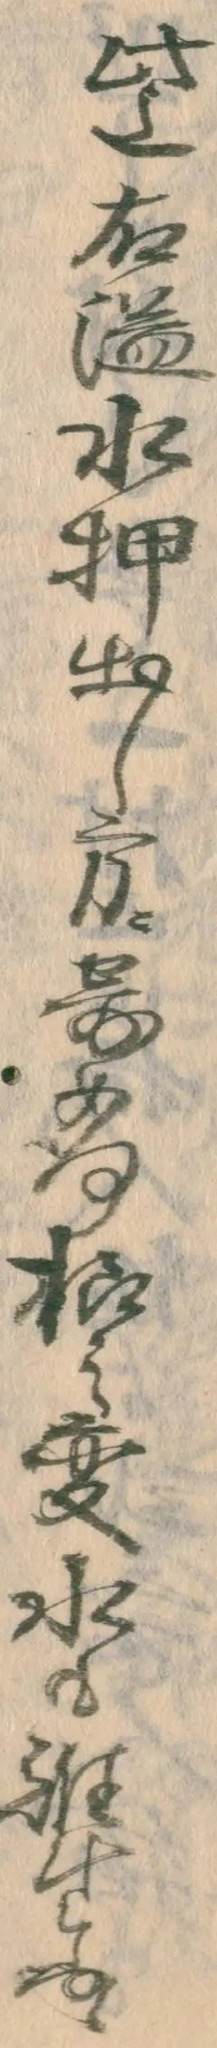此上右溢水押出し方ニ寄如何様之変水も難計奉存候
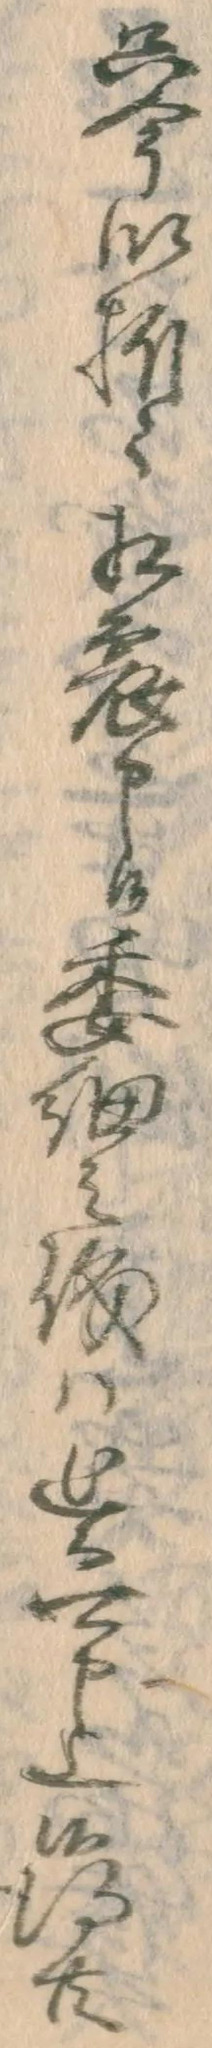只今以折々相震申候委細之儀ハ追而可申上候得共
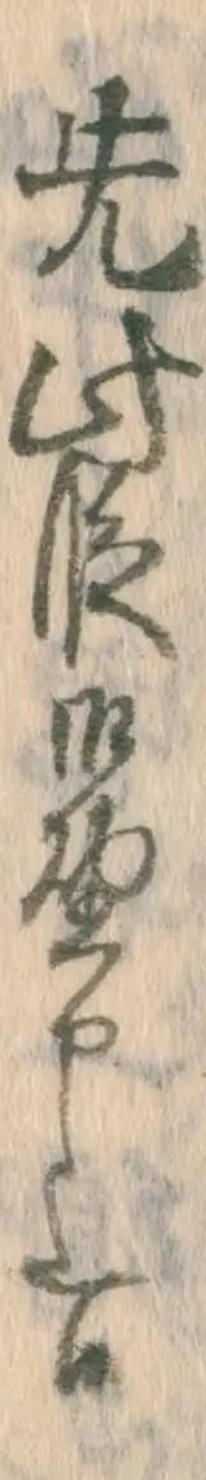先此段御届申上候
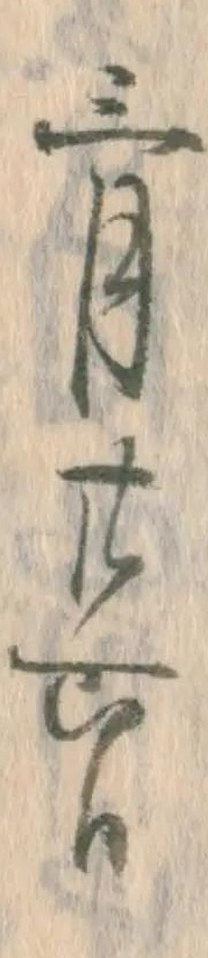三月廿六日
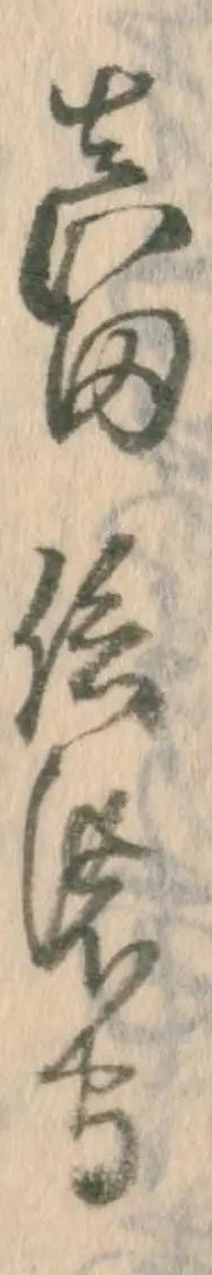真田信濃守
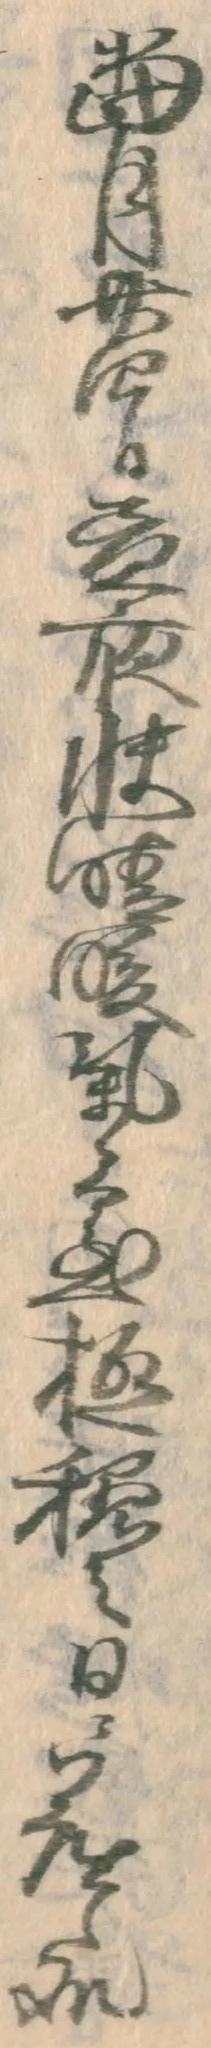当月廿四日昼夜快晴暖気ニ而至極穏之日ニ御座候処
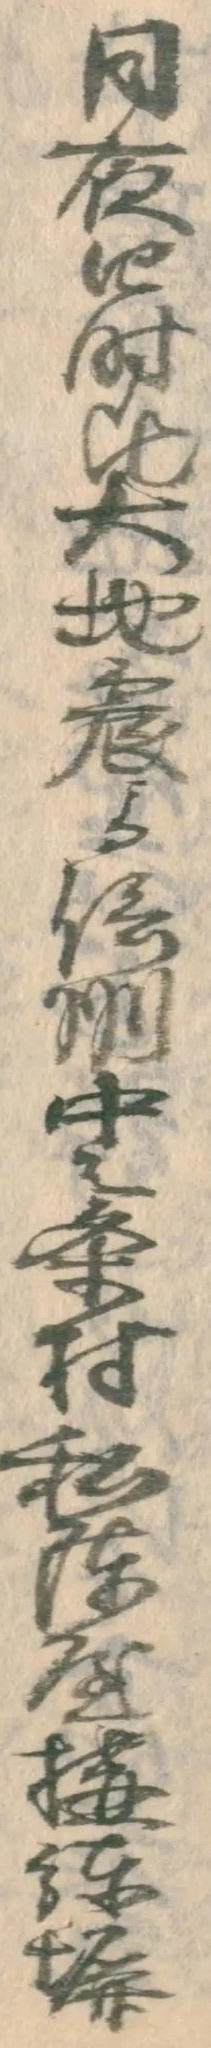同夜四時比大地震ニ而信州中之条村私陣屋構練塀
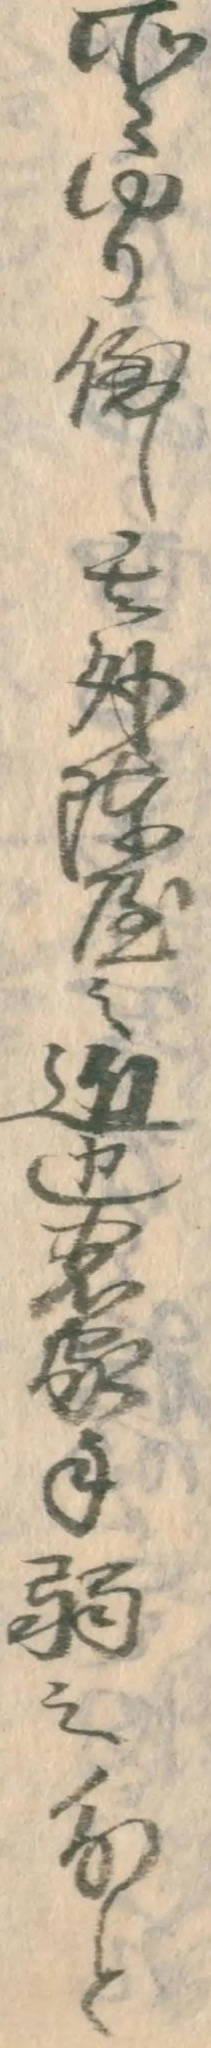所々ゆり倒し其外陣屋之近辺農家手弱之分之
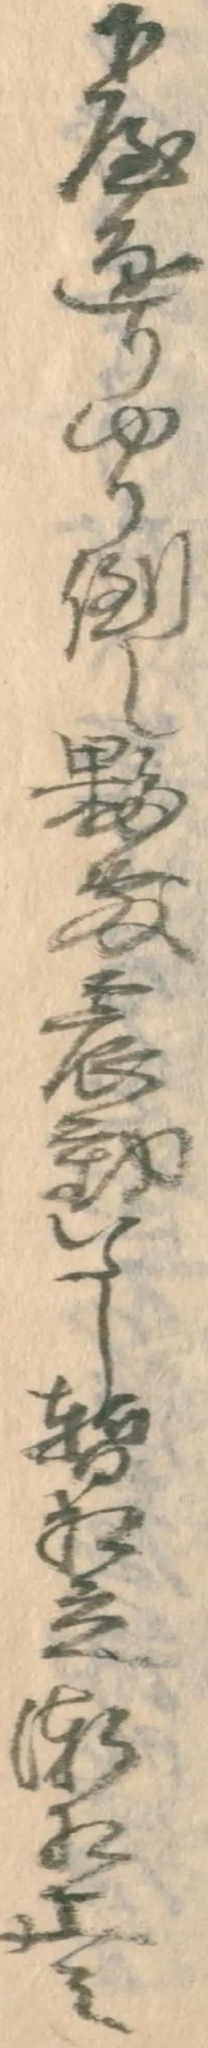下家廻りゆり倒し夥敷震動いたし暫相立漸相止ミ
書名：信州大地震之記
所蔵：国立国会図書館 National Diet Library, JAPAN
